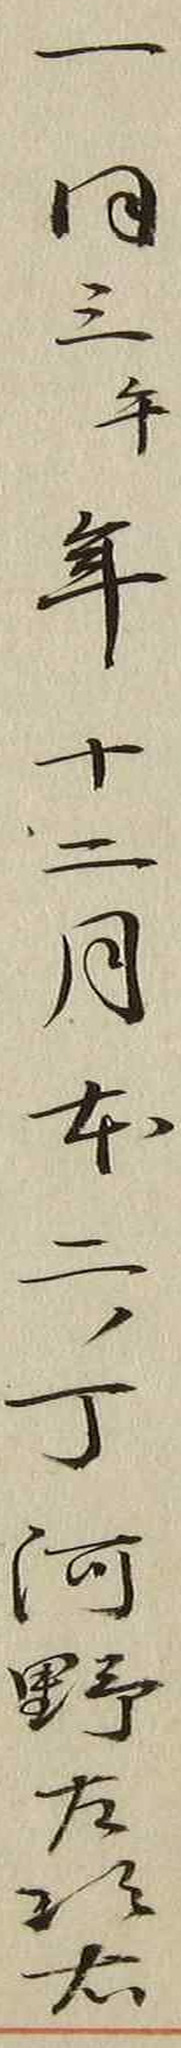一同三午年十二月本二ノ丁河野左次右
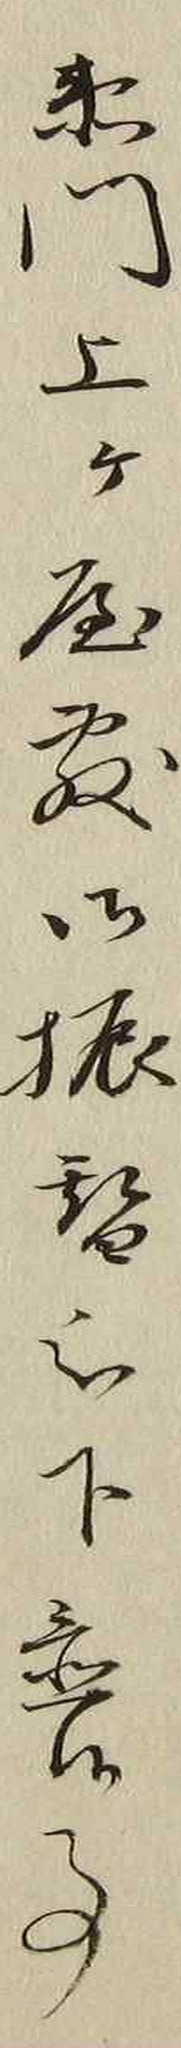衛門上ケ屋敷御振替被下置候事
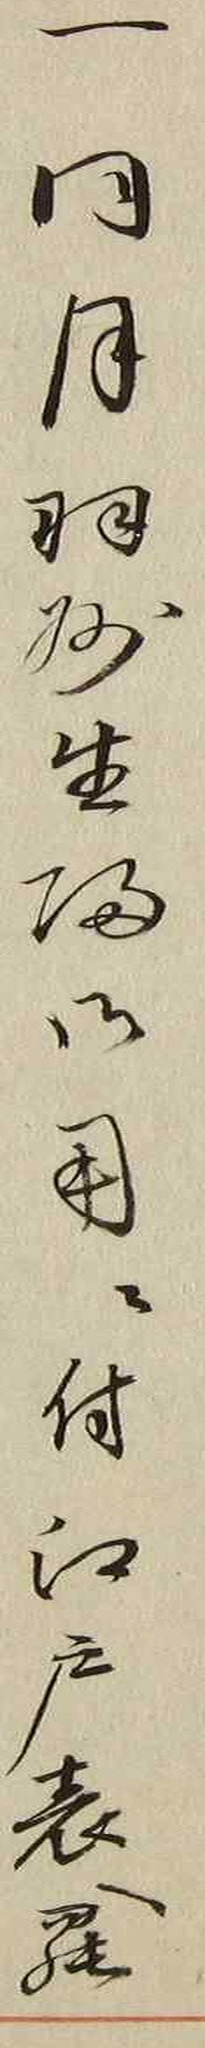一同月羽州生帰御用ニ付江戸表へ罷
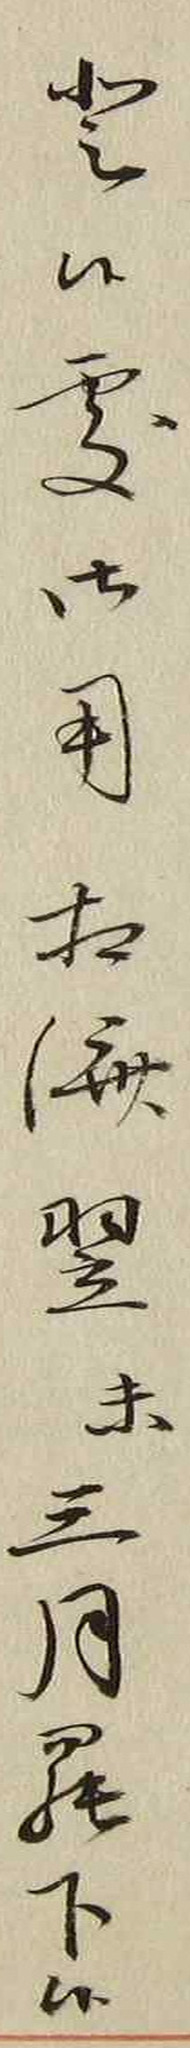登候処御用相済翌未三月罷下候
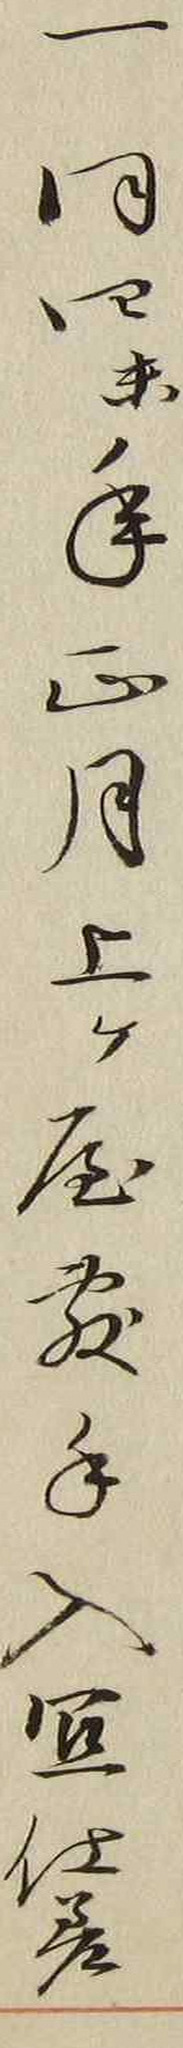一同四未年正月上ケ屋敷手入宜仕差
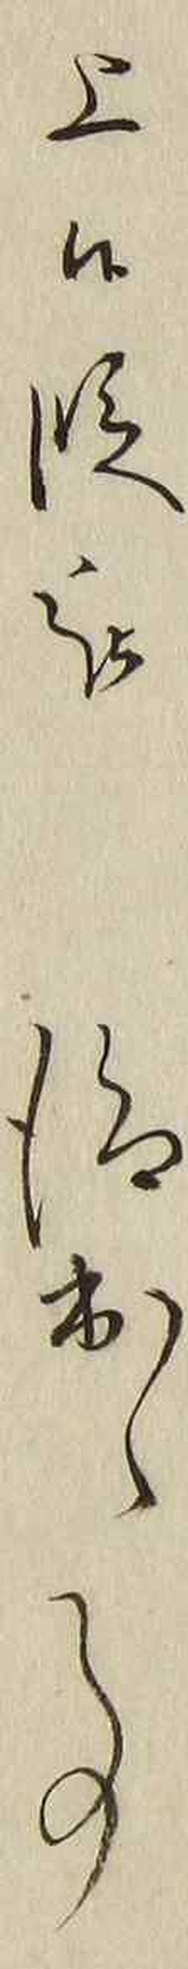上候段被仰出候事

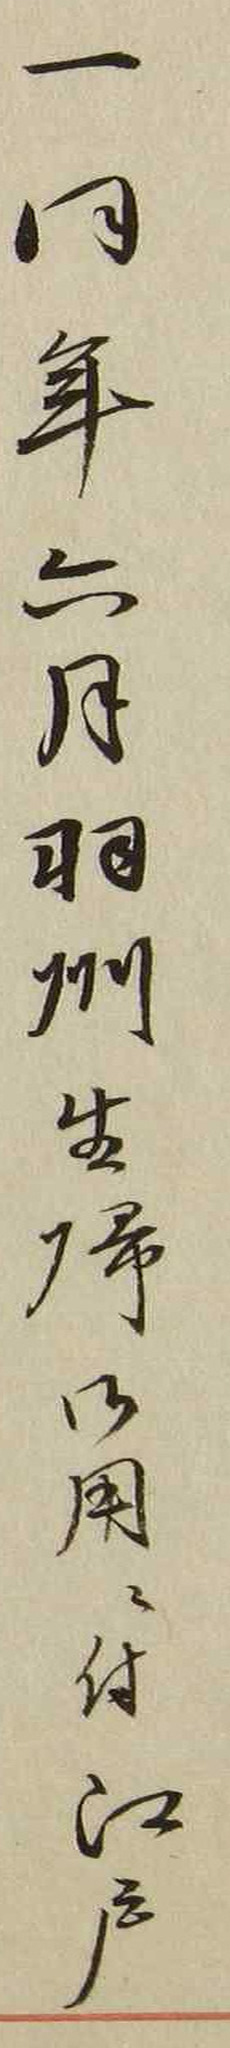一同年六月羽州生帰御用ニ付江戸
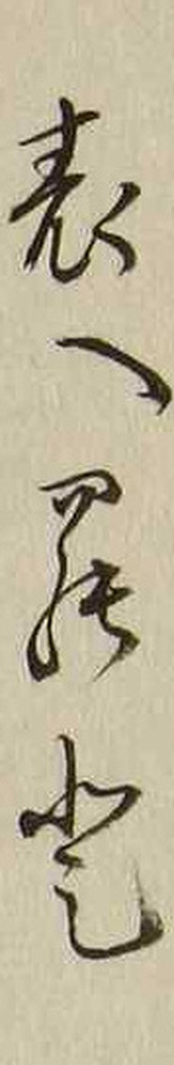表へ罷登
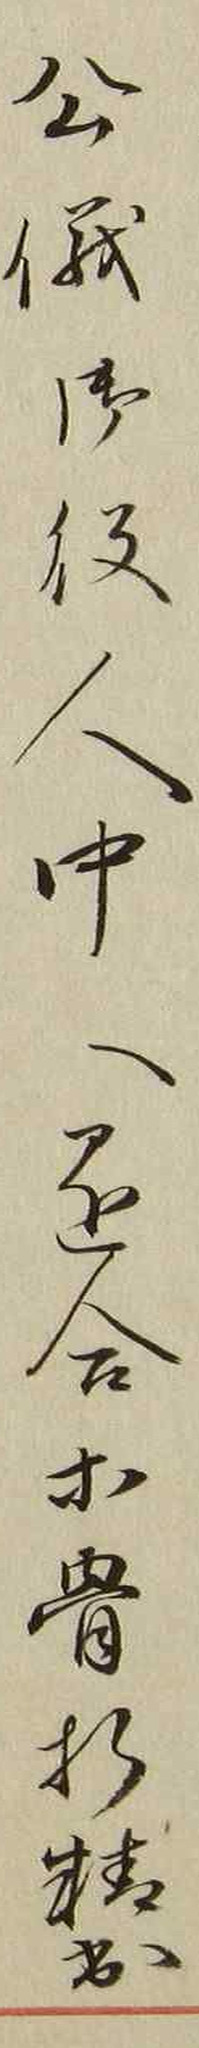公儀御役人中へ懸合等骨折精出
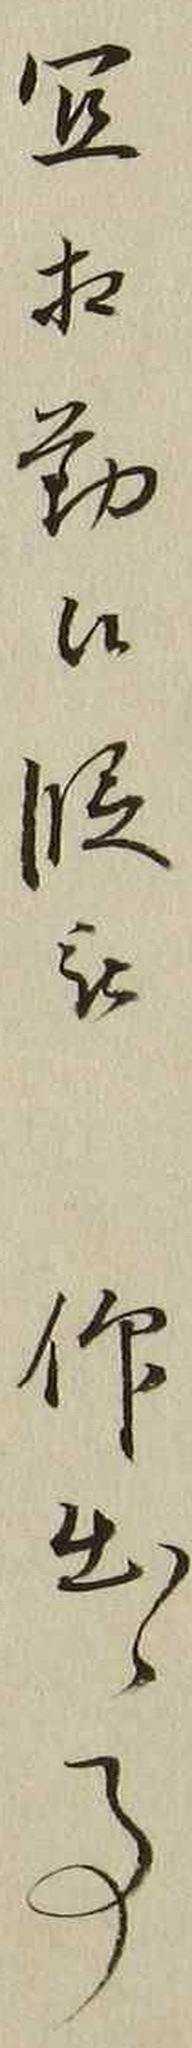宜相勤候段被仰出候事
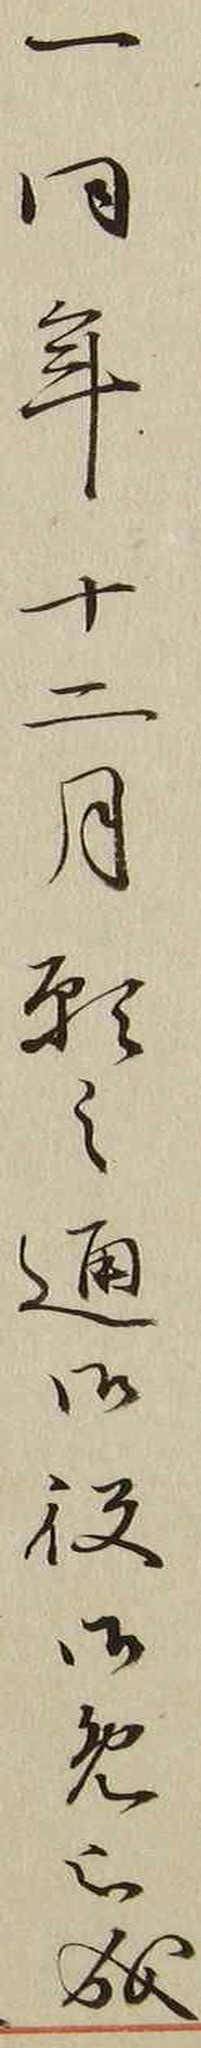一同年十二月願之通御役御免被成
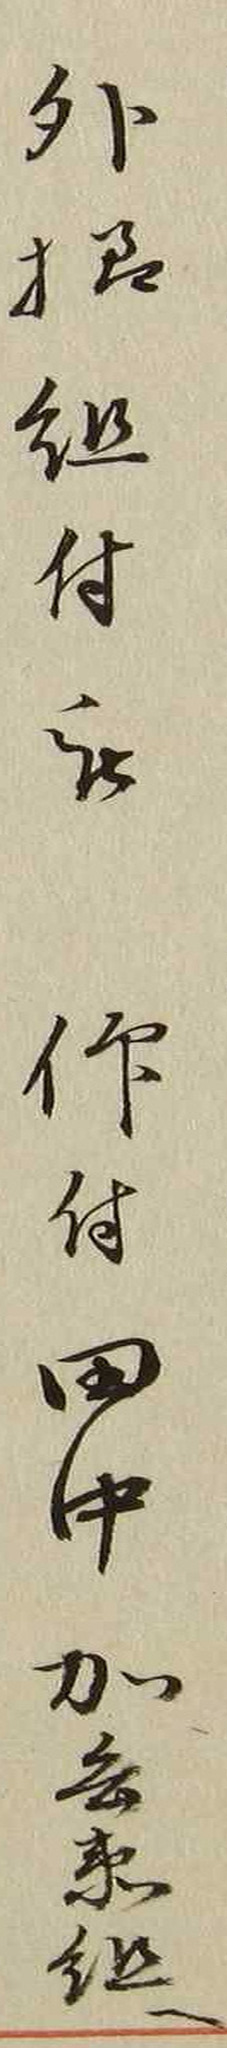外様組付被仰付田中加兵衛組へ
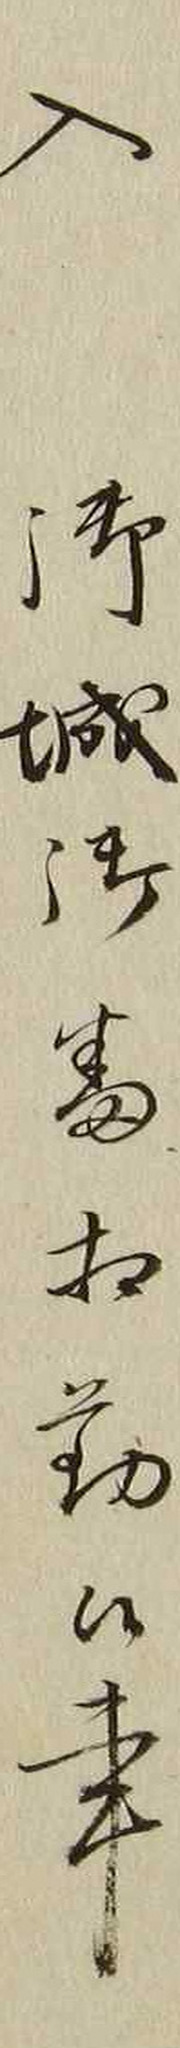入御城御番相勤候事
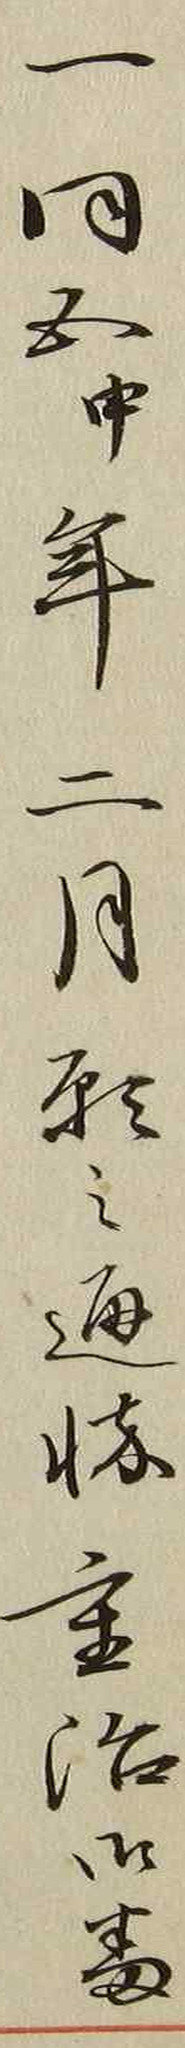一同五申年二月願之通悴重治御番
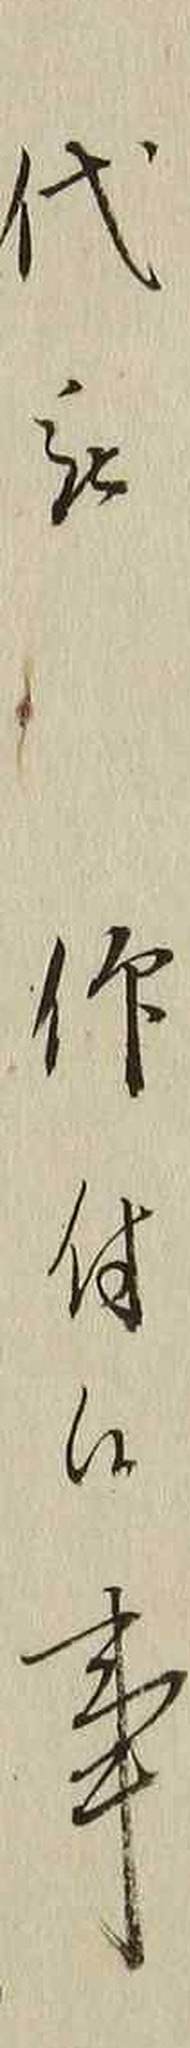代被仰付候事
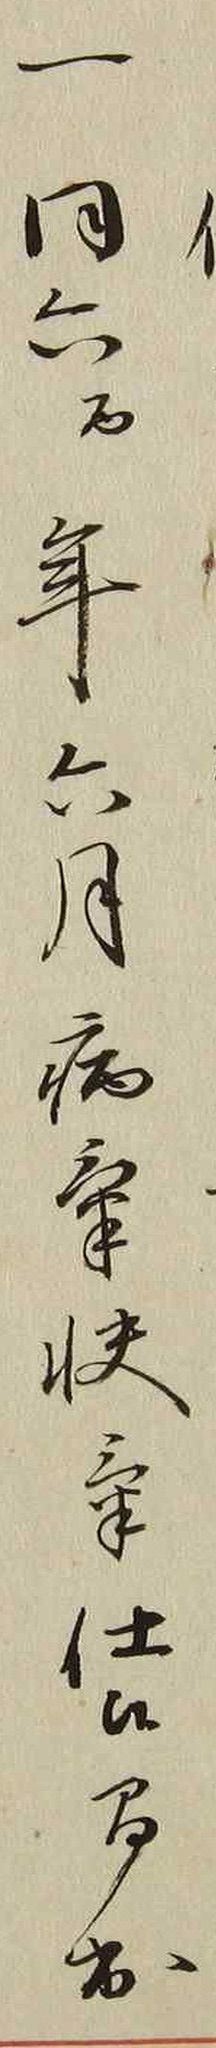一同六酉年六月病気快気仕候間出
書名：諸士系譜　巻之22　い之部22
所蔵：会津若松市立会津図書館
